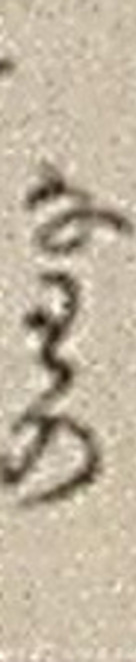なわの
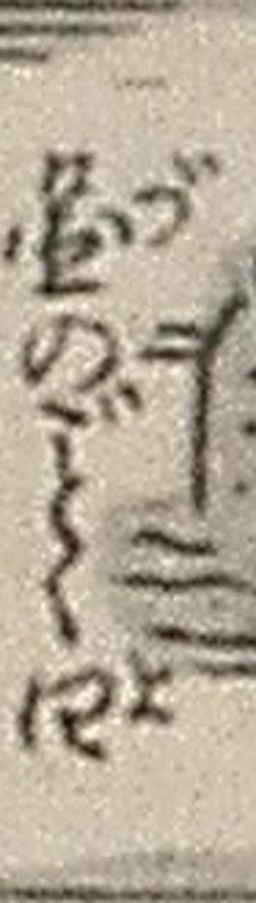図のごとく四
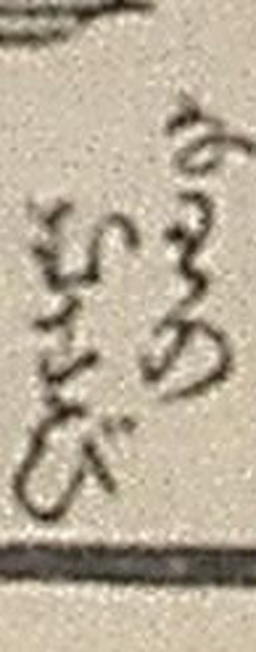むすび
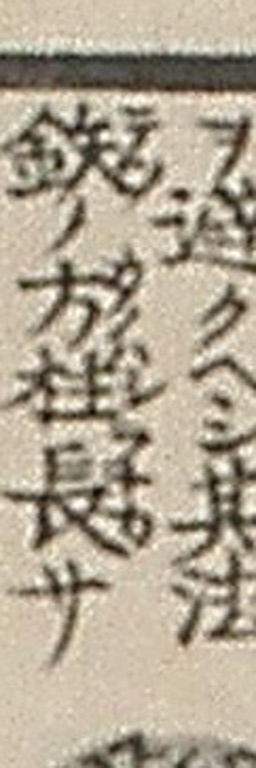鉄ノ方柱長サ
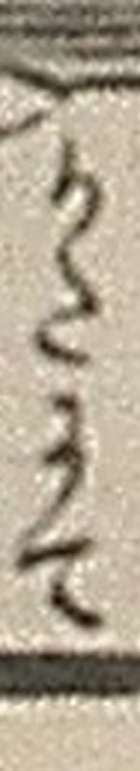かたにて
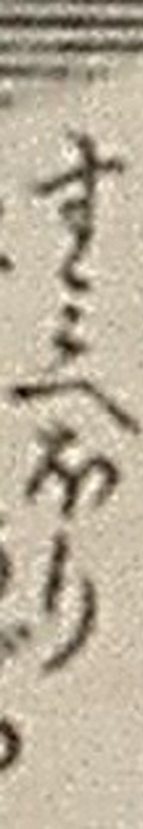すみへほり
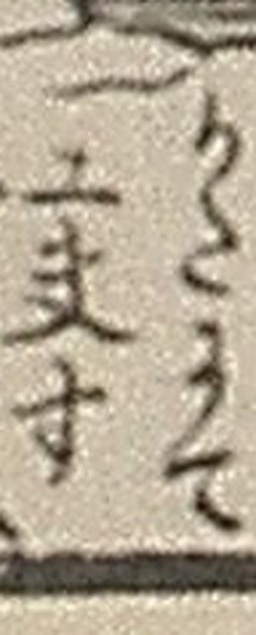工夫す
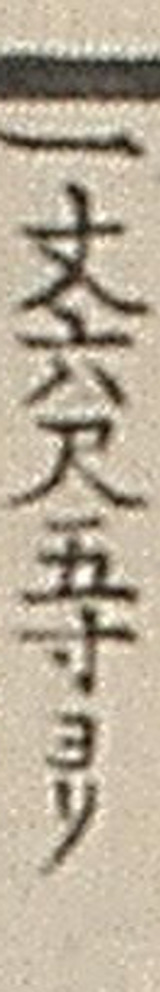一丈六尺五寸ヨリ
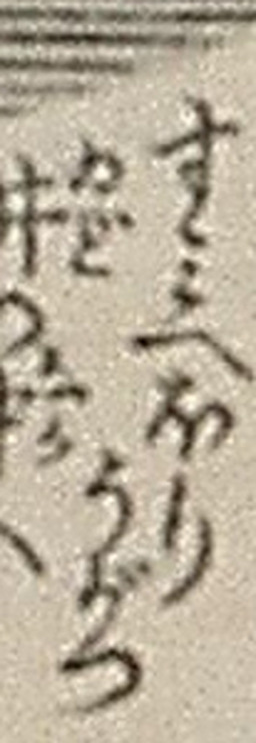井の中へ
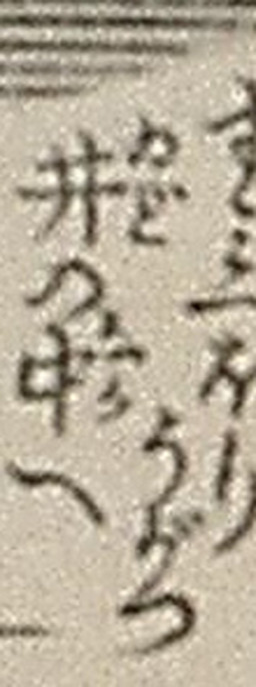井の中へ
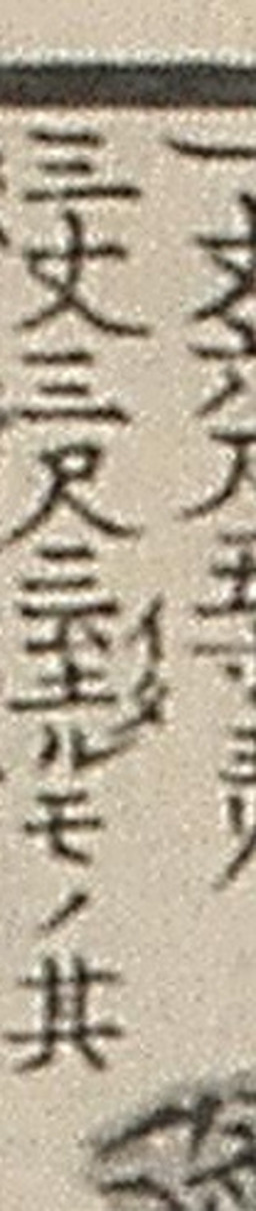三丈三尺ニ至ルモノ其
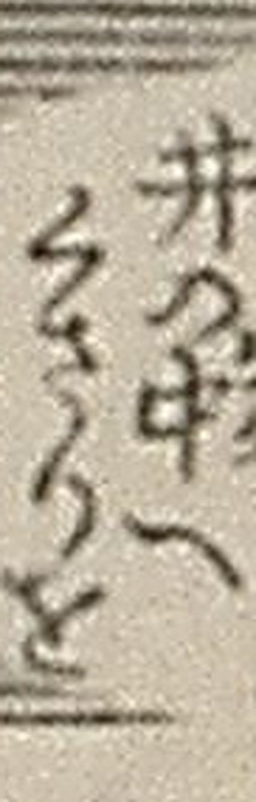くさりを
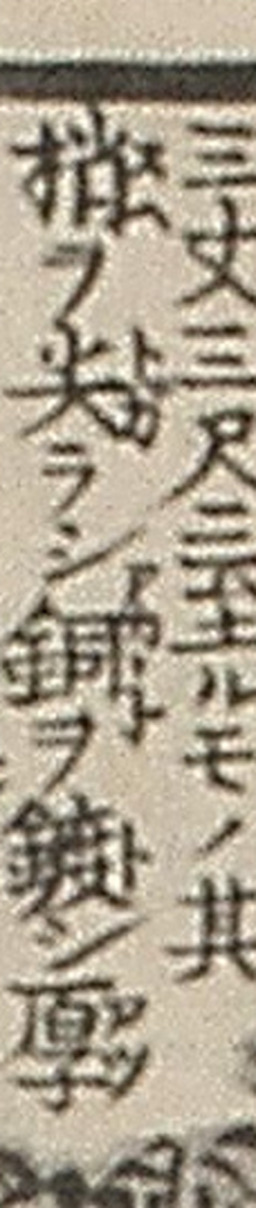梢ヲ尖ラシ銅ヲ鍍シ厚
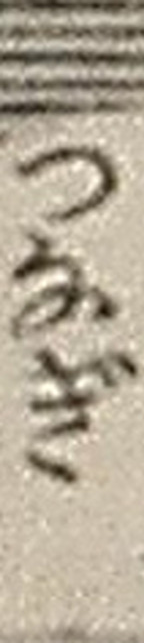つなぎ
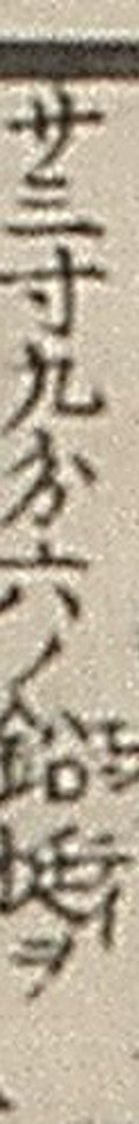サ三寸九分六ノ鉛挺ヲ
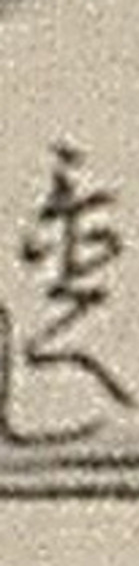置へし
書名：大地震暦年考　全
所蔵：東京大学地震研究所図書室 Earthquake Research Institute Library, The University of Tokyo, JAPAN
